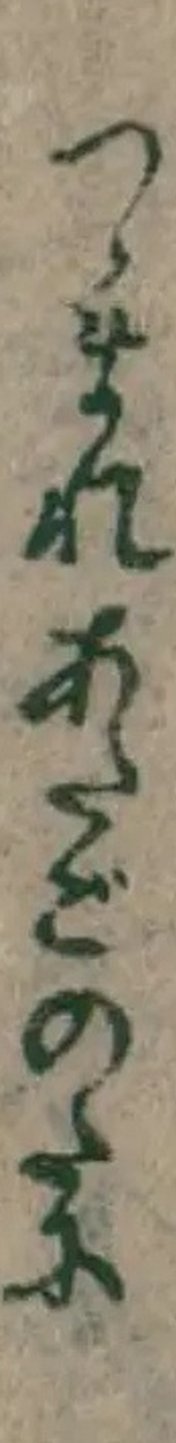つゝまれあたごのたに
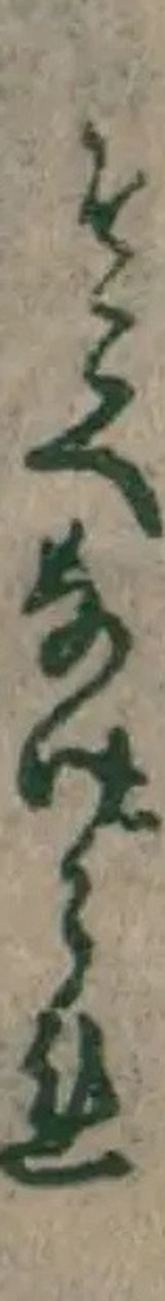そこへなげられ
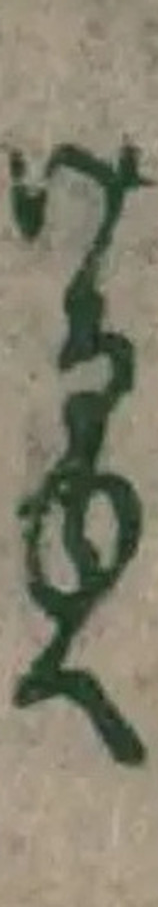けるゆへ
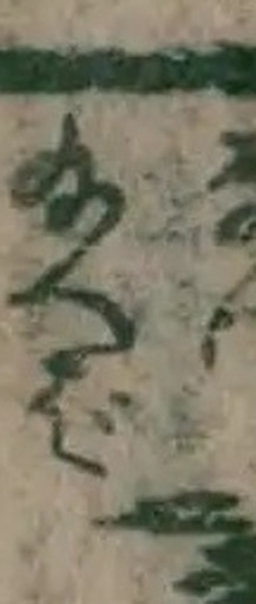給へば
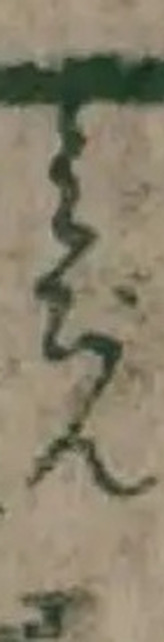みぢん
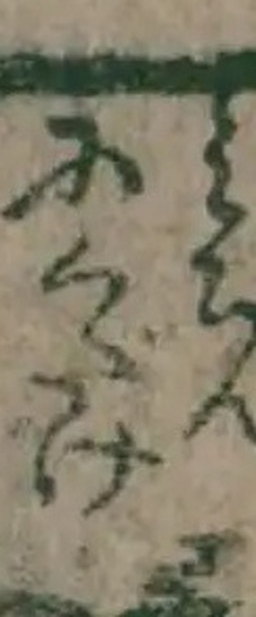にくだけ

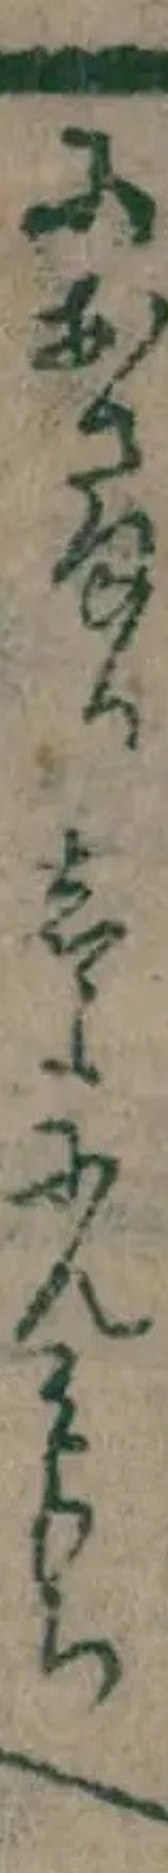におさまりしよにんみもち
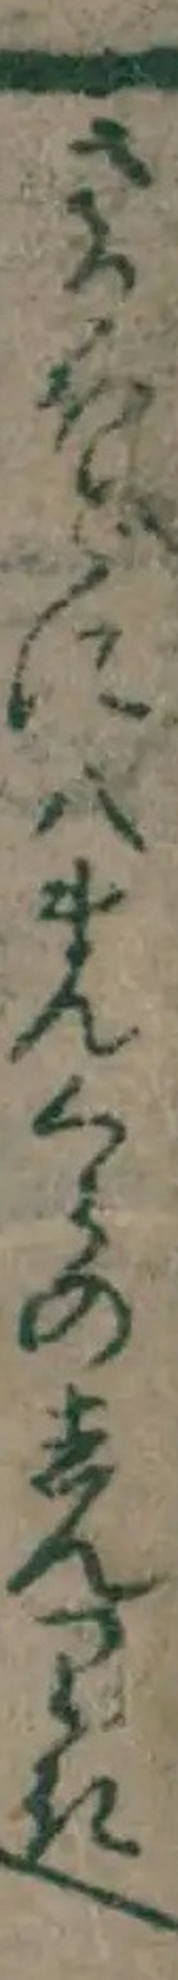さるほどに八まんくうのしんつうき
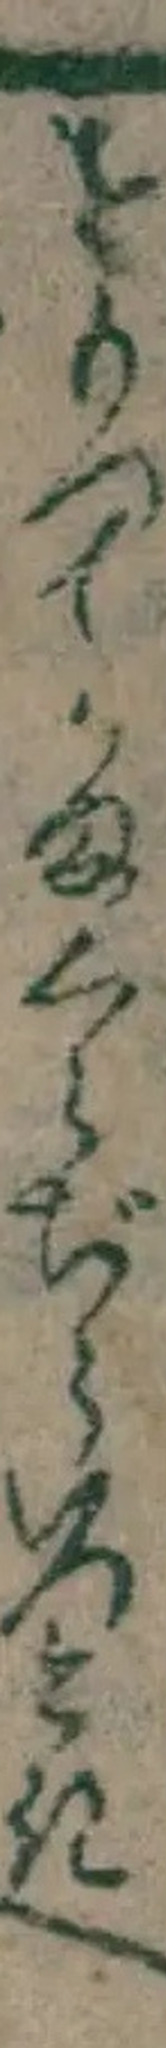をもつてかまくらぢういつとき
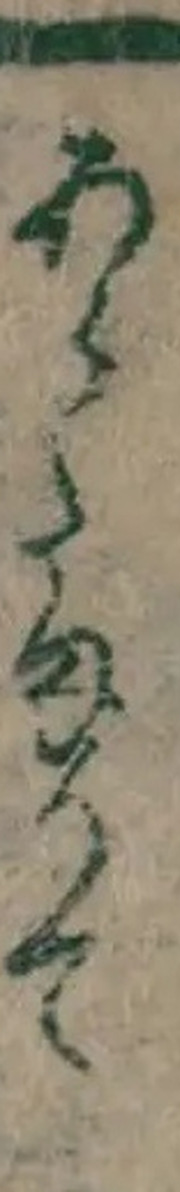あらたまりて
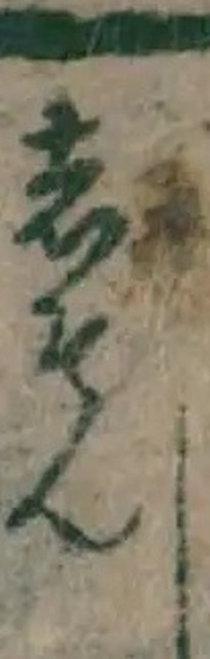しそん
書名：頓作時雨月 3巻
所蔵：国立国会図書館 National Diet Library, JAPAN
